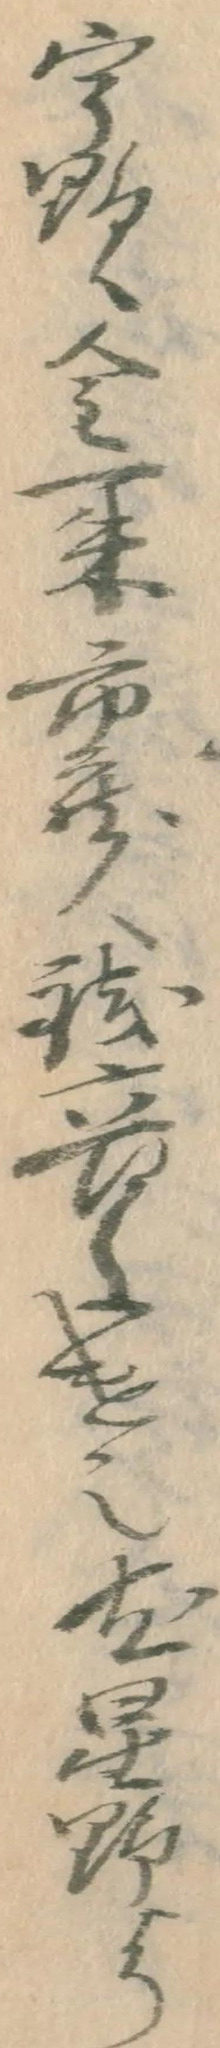うのへ金一朱市蔵へ銭六百文遣之尤星野より

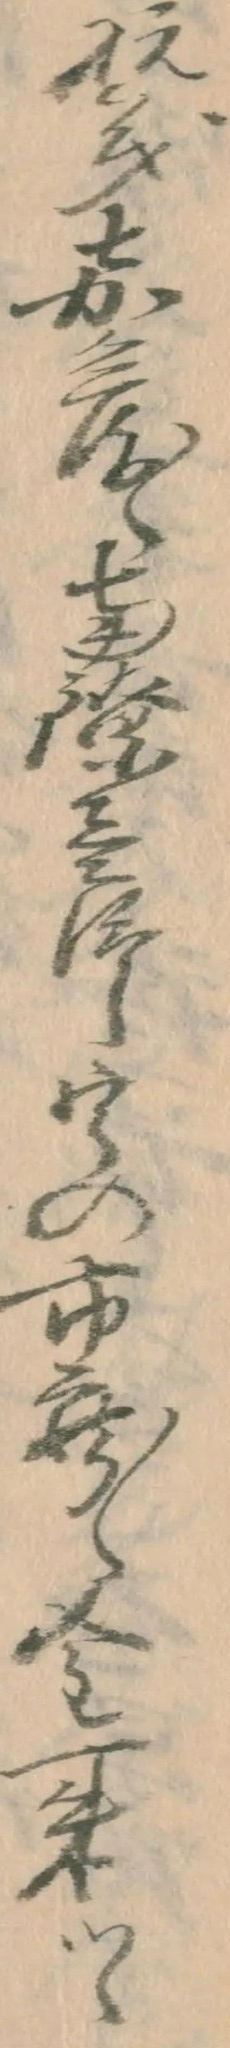祝義嘉兵衛へ南鐐壱片うの市蔵へ金一朱ツヽ
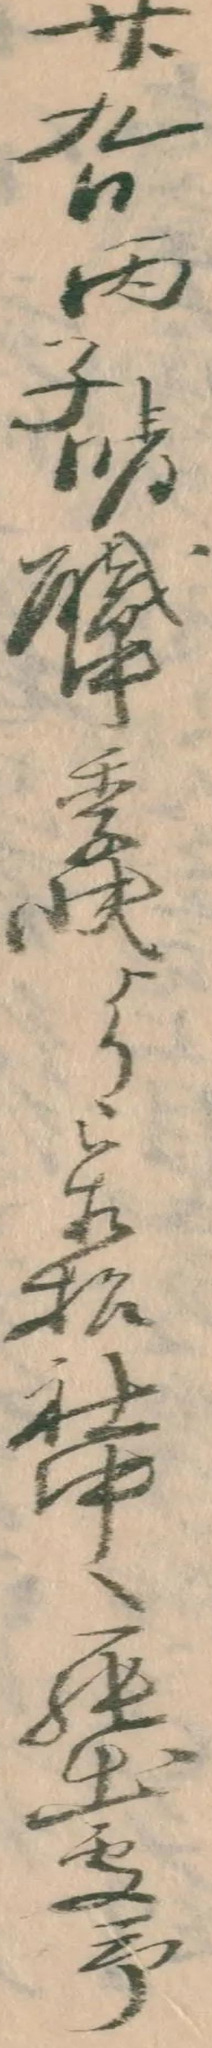廿九日丙子晴職中季快より被相招社中へ罷出處予
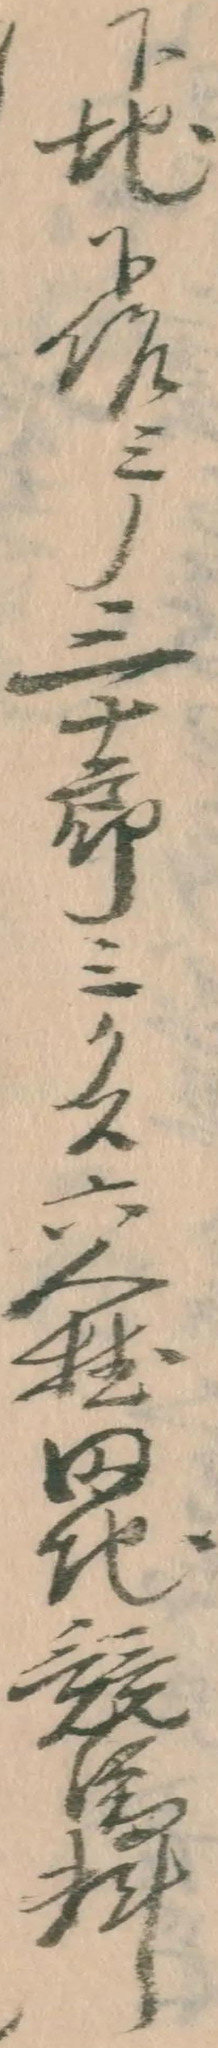下地下作三ノ三十郎ミクス六人植田地競馬料
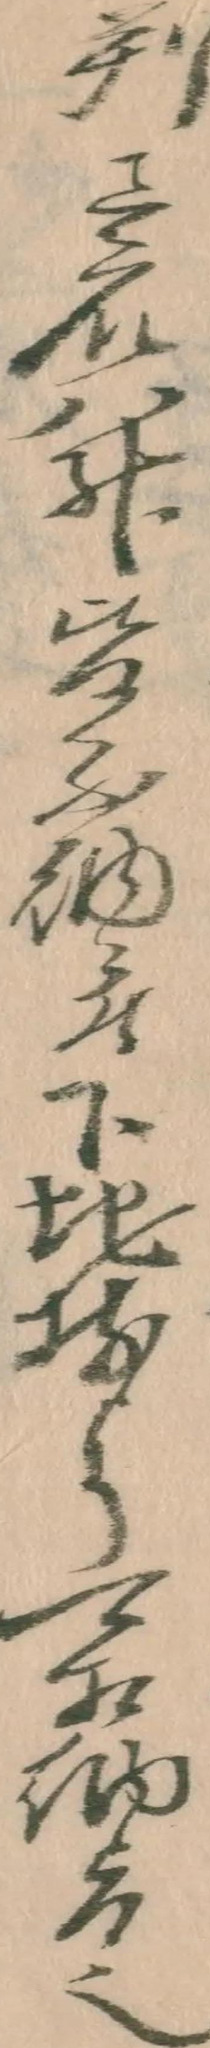判壱石八升皆不納二付下地持より可相納旨也
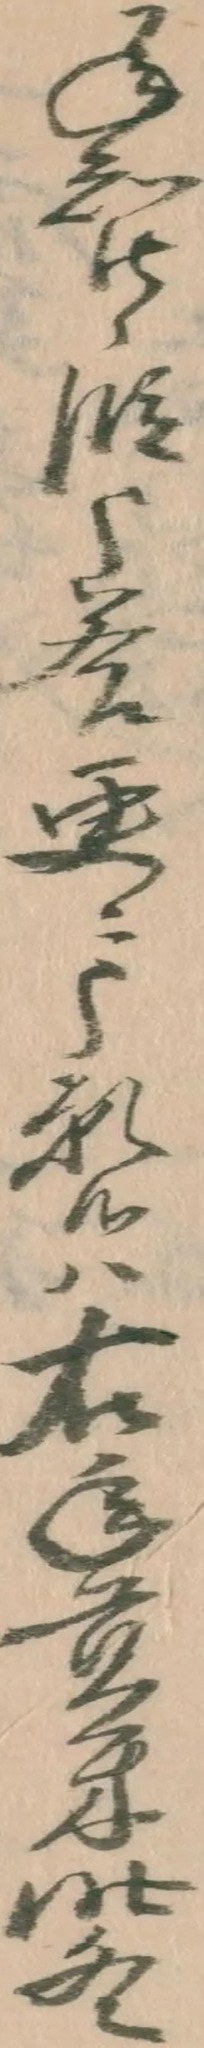承知仕候段申答更ニ申頼候ハ右年貢米昨冬
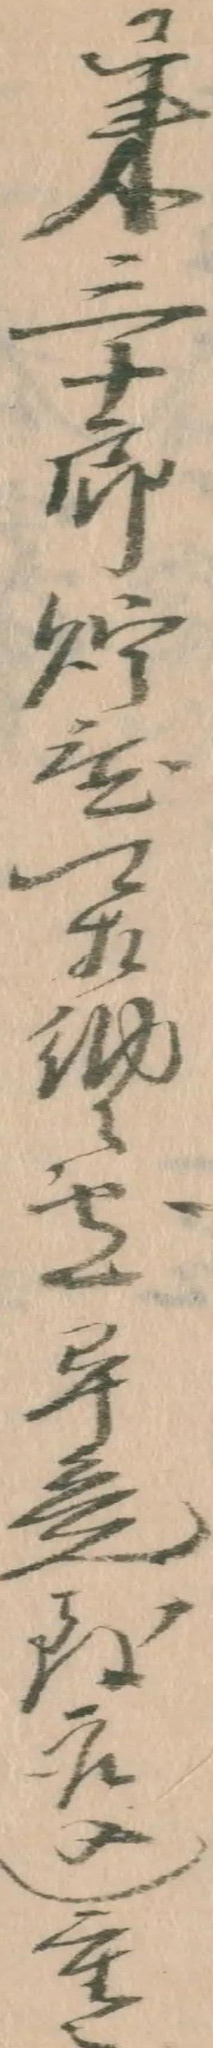已来三十郎貯置可相納之處畢竟致取込重々
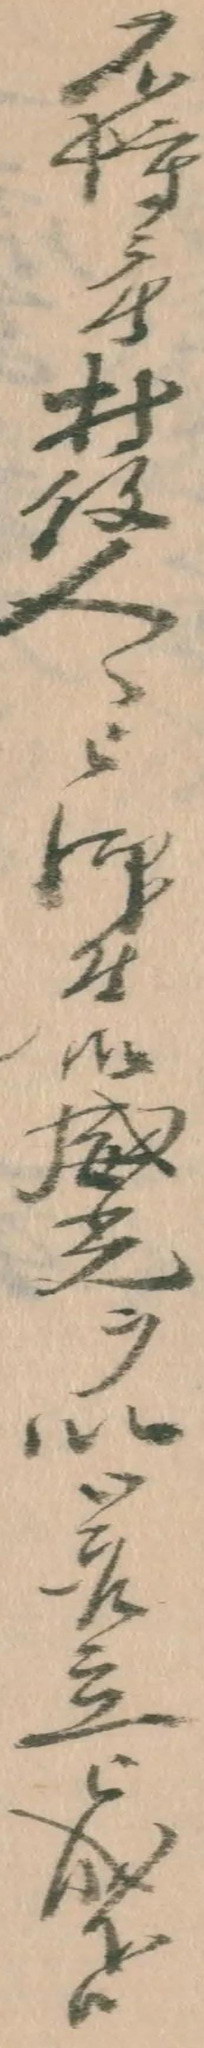不埒ニ付村役人へ被仰付御威光ヲ以御差立被成下候
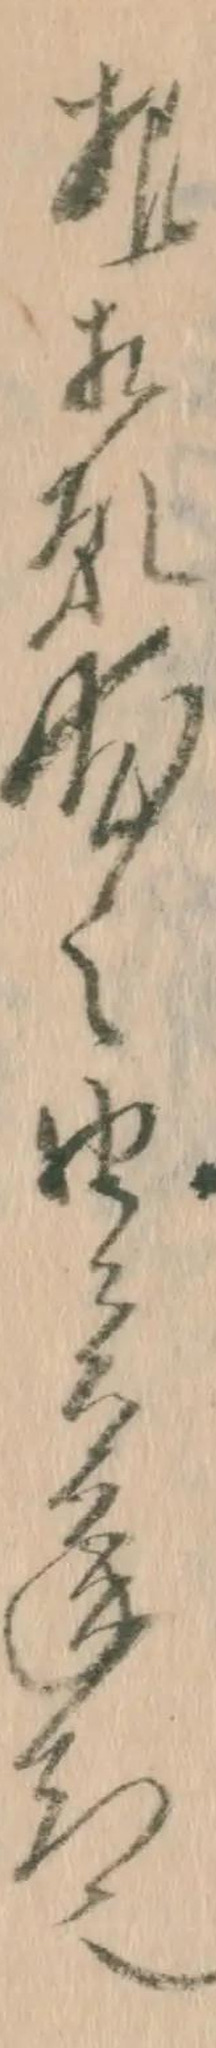難相願尤之由ニ而承知也
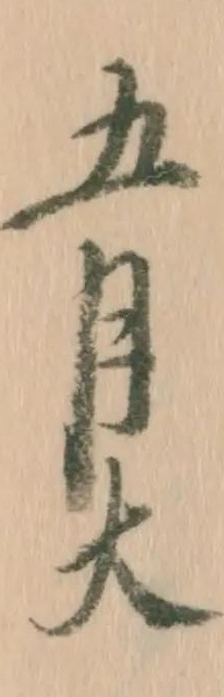五月大
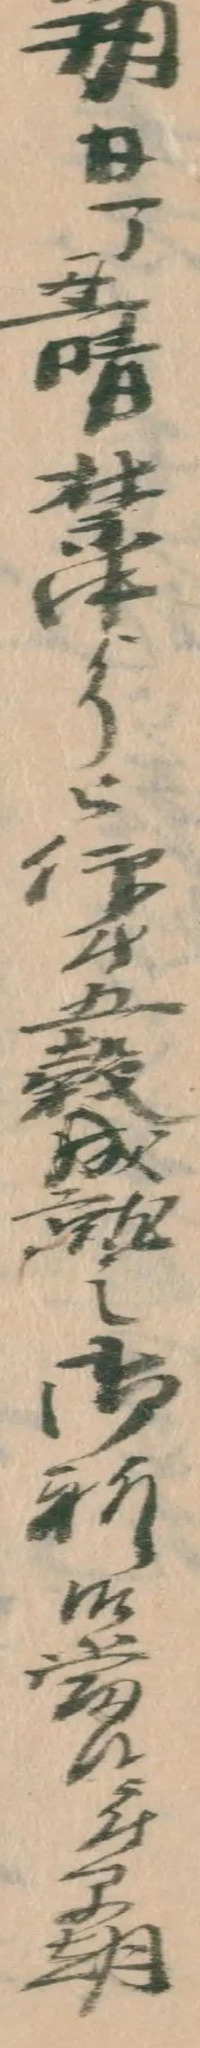朔日丁丑晴禁中より被仰付五穀成就之御祈御當日ニ付早朝
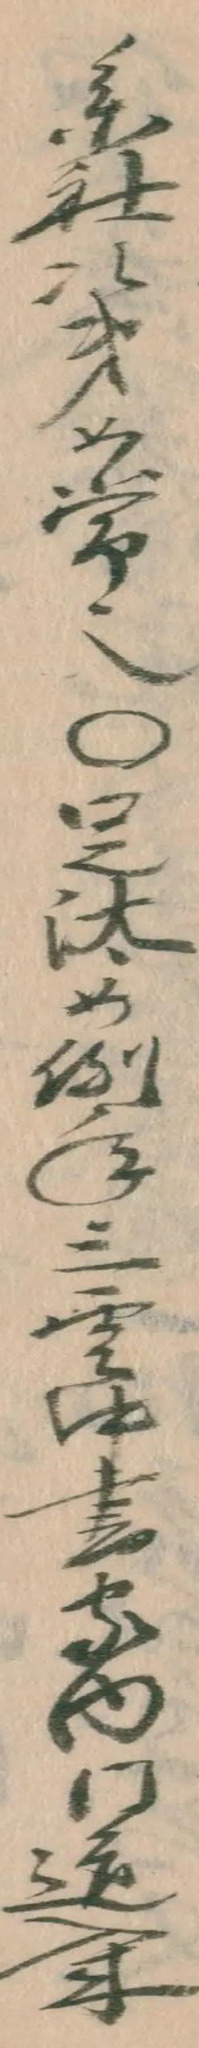参社次第如常也○足汰如例年三雲中書家内同道入来
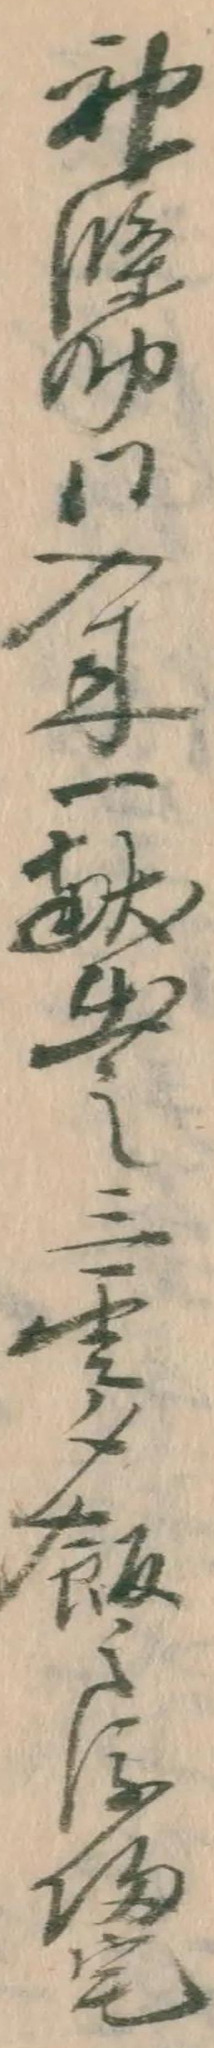神條助同入来一献出也三雲夕飯之後帰宅也
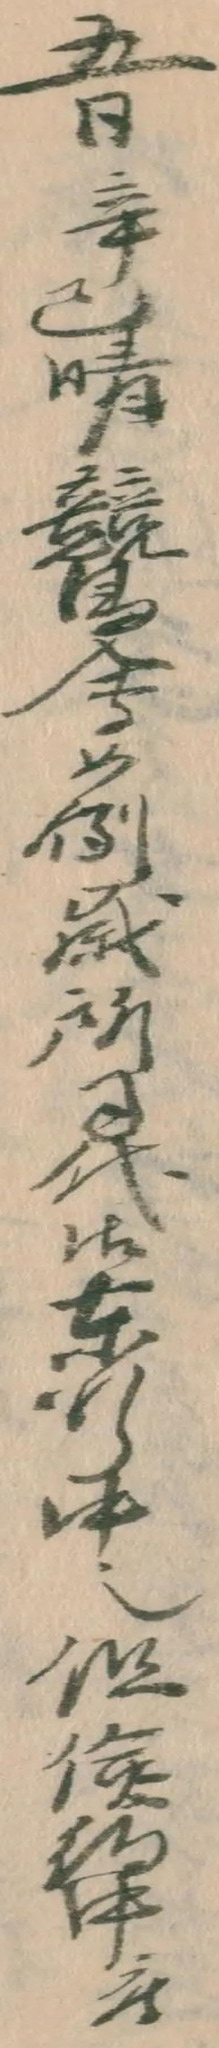五日辛巳晴競馬會如例歳所司代御奉行中也但倹約中ニ付
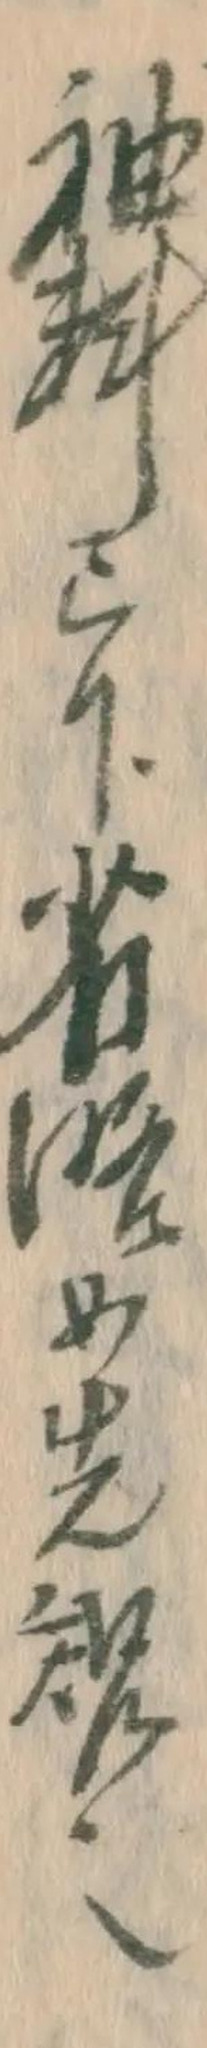神料已下省略如先規也
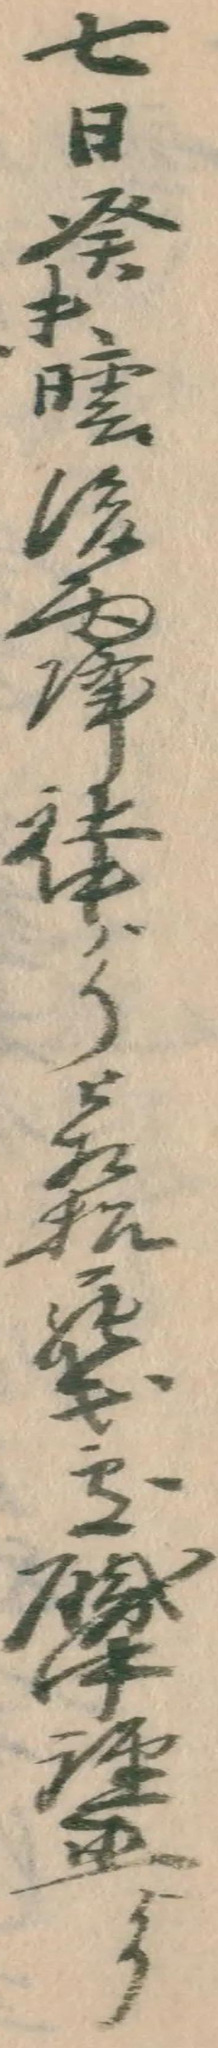七日癸未曇後雨降社中より被相招罷出處職中謹直より
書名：賀茂社記録. 第67冊
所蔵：国立国会図書館 National Diet Library, JAPAN
